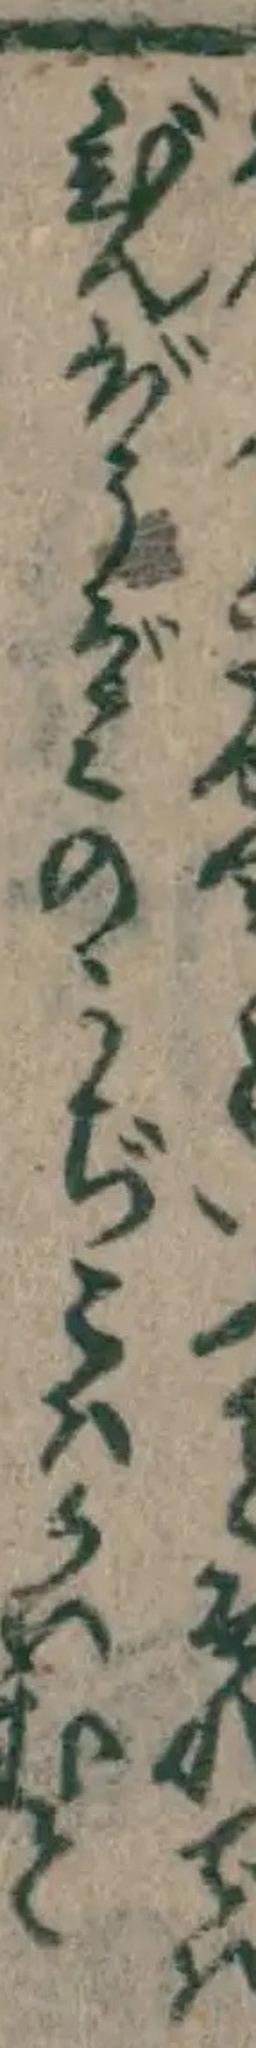びんぼうがみのうじこはかれむと
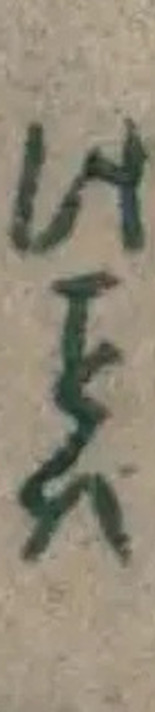此ことは
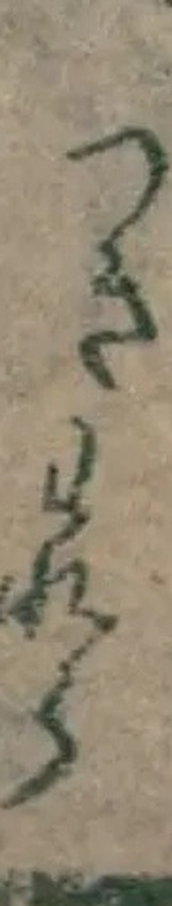つきわれら
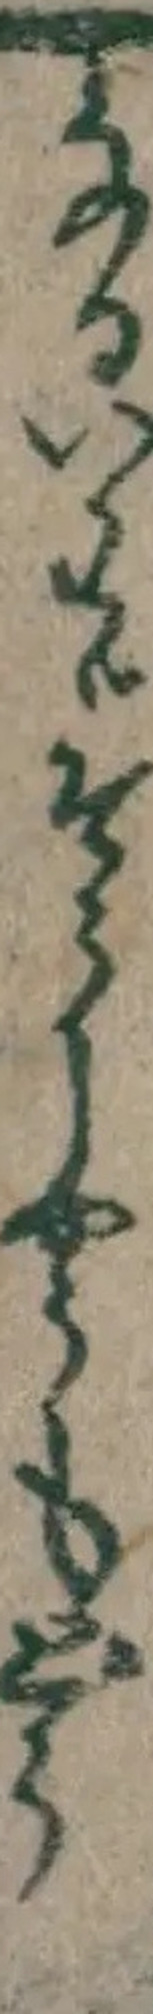なるいわゞそうしやうもどら
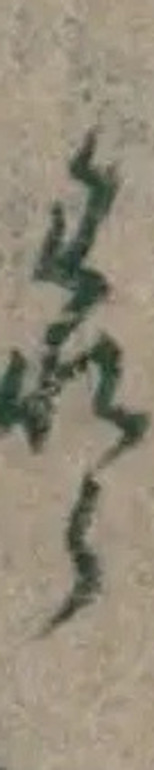われら
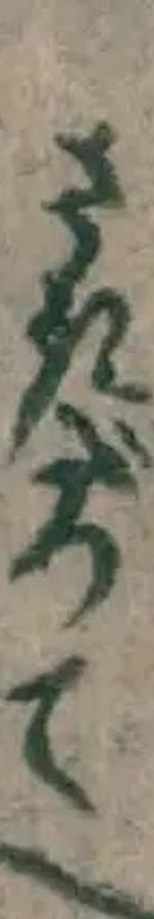さきだつて
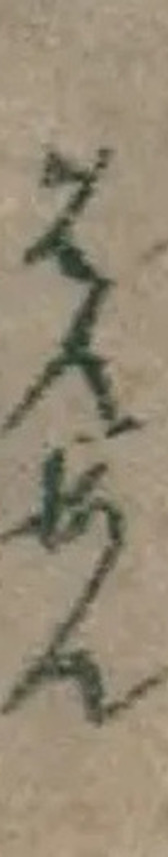はんめん
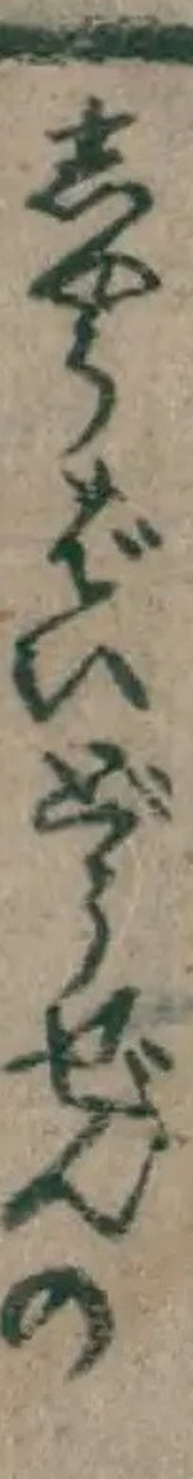しやうばいどうぜんの
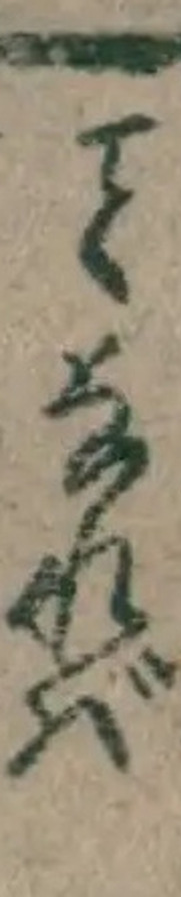ことなれば
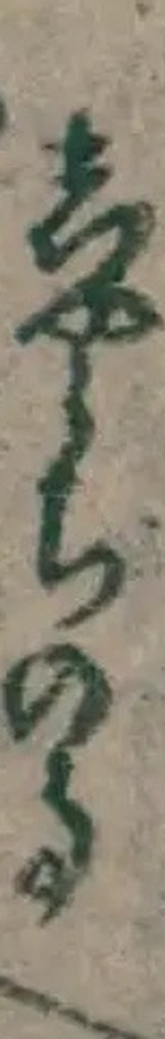しやうちの事
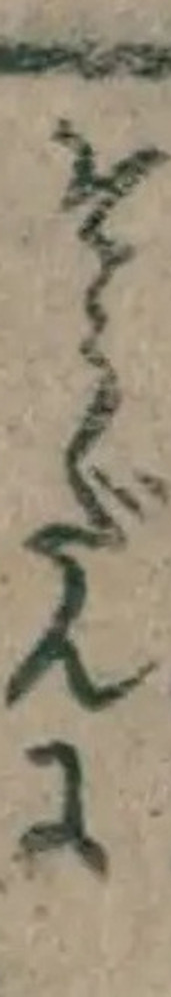そうだんに
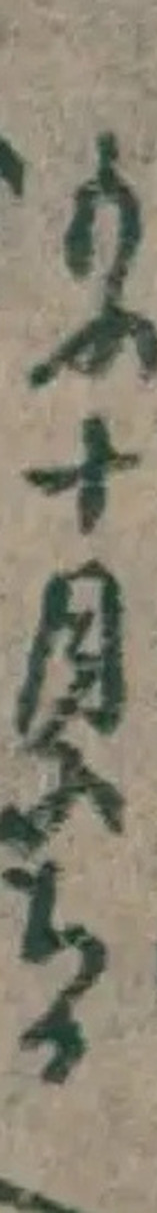もふ十月にちか
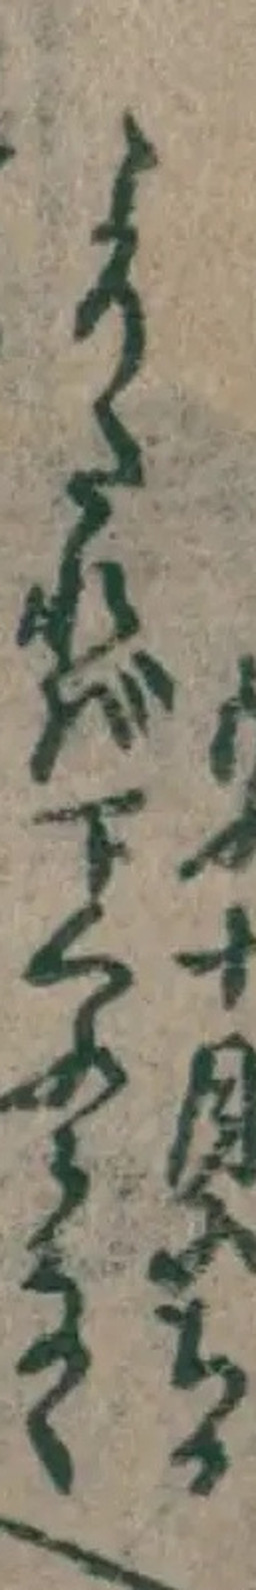よりたれば一トくふうなく
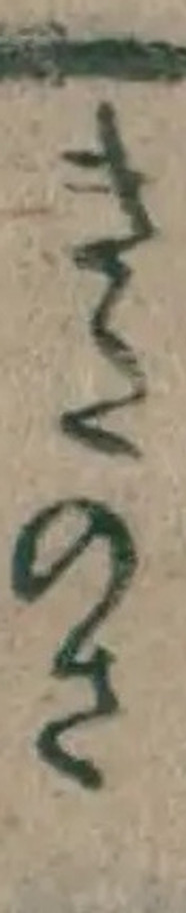きたのさ
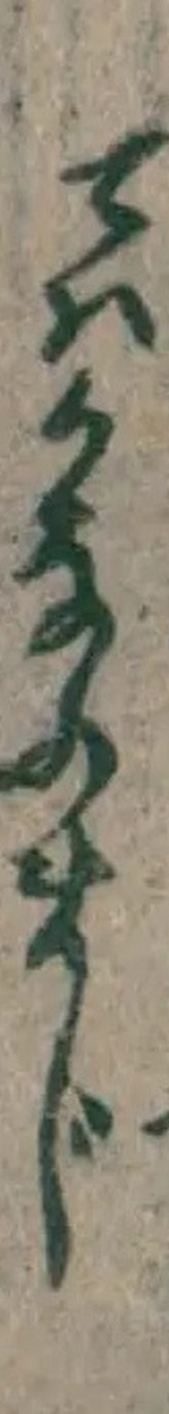てはかなふまじ
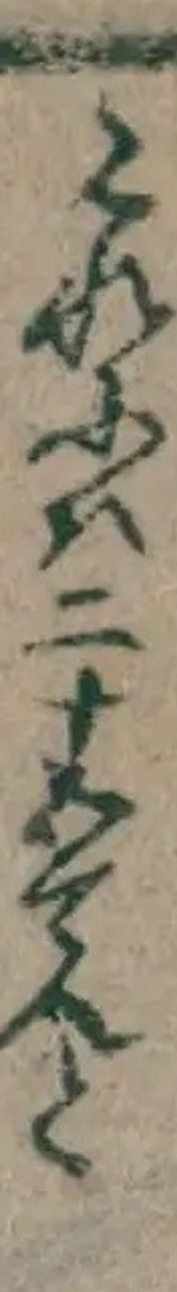これには二十五てんと
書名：頓作時雨月 3巻
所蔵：国立国会図書館 National Diet Library, JAPAN
